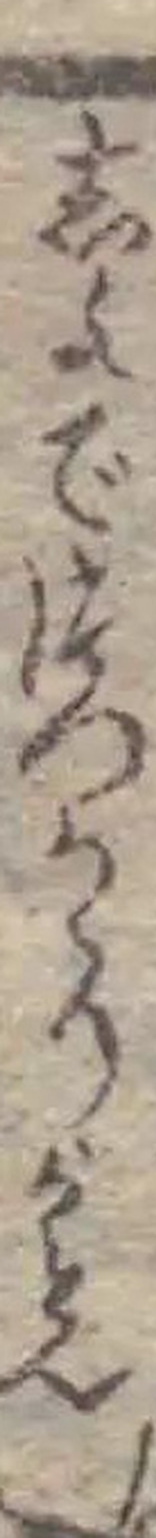しよでつつかゝりかとん
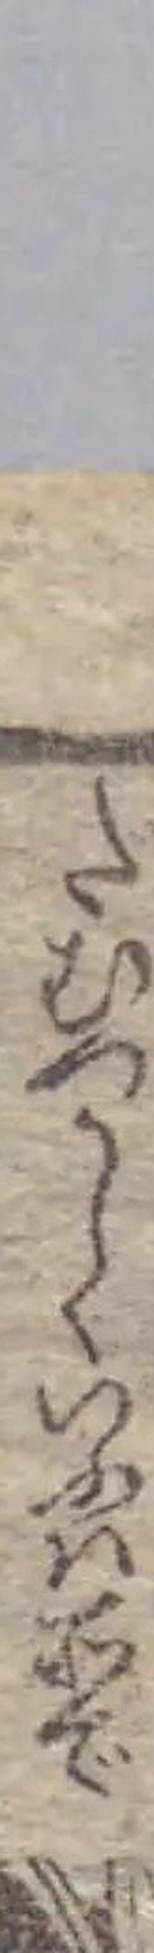だむつかしくいふは所で
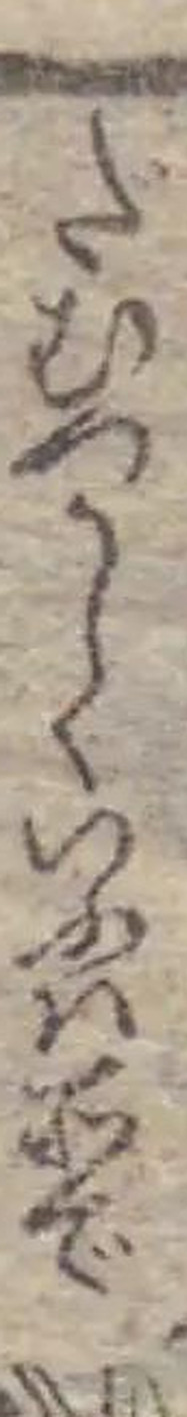だむつかしくいふは所で
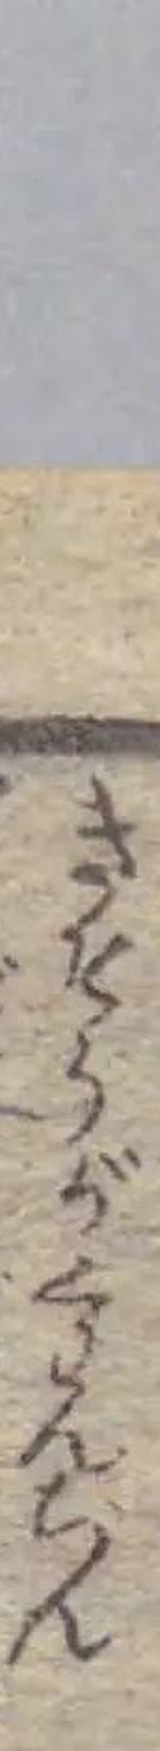きそうがくわんちん
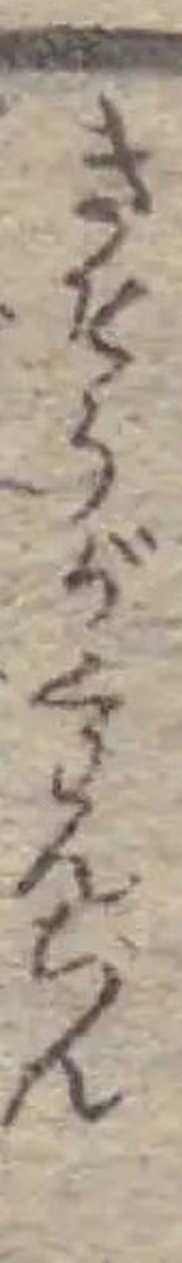きそうがくわんちん
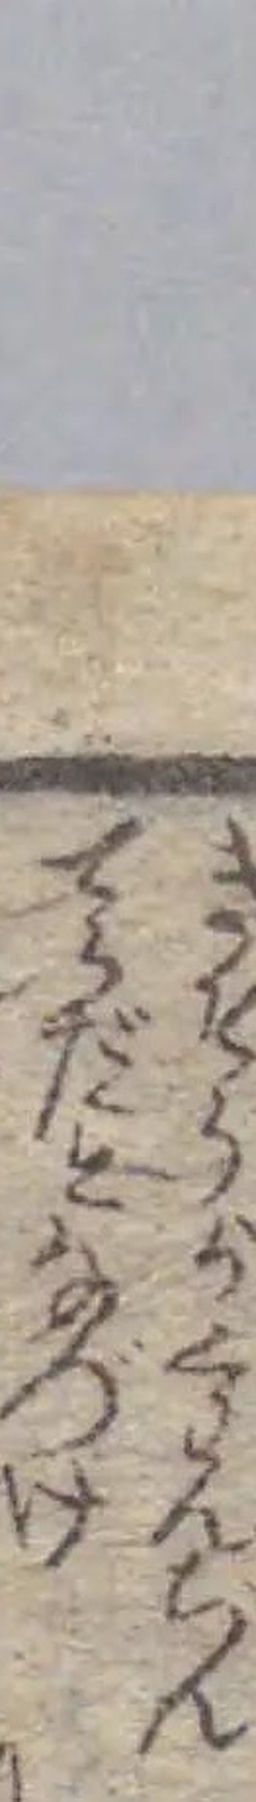てうだとなづけ
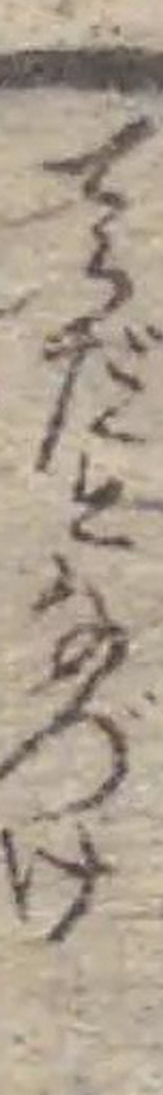てうだとなづけ
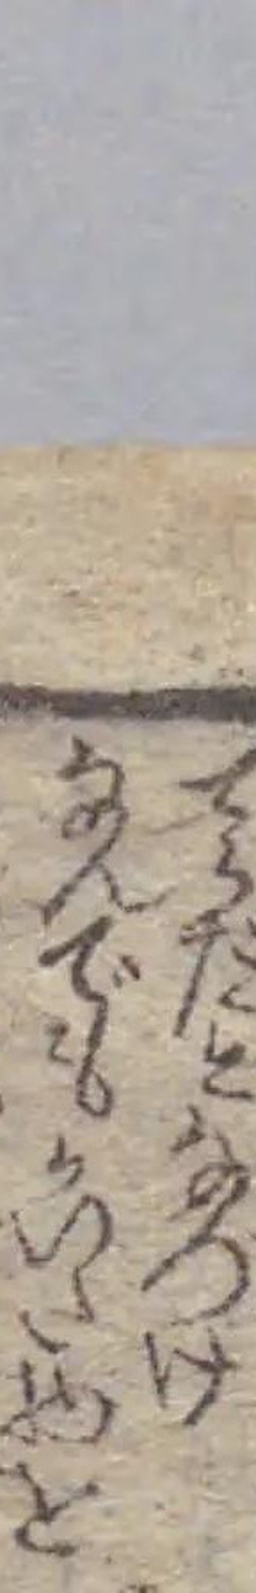なんでもかいた物を
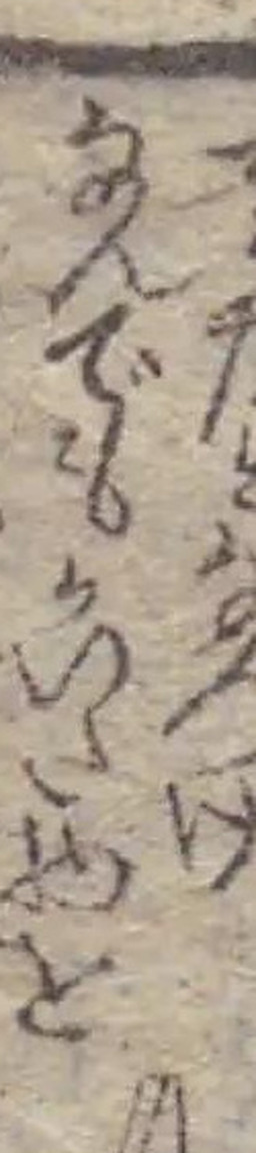なんでもかいた物を
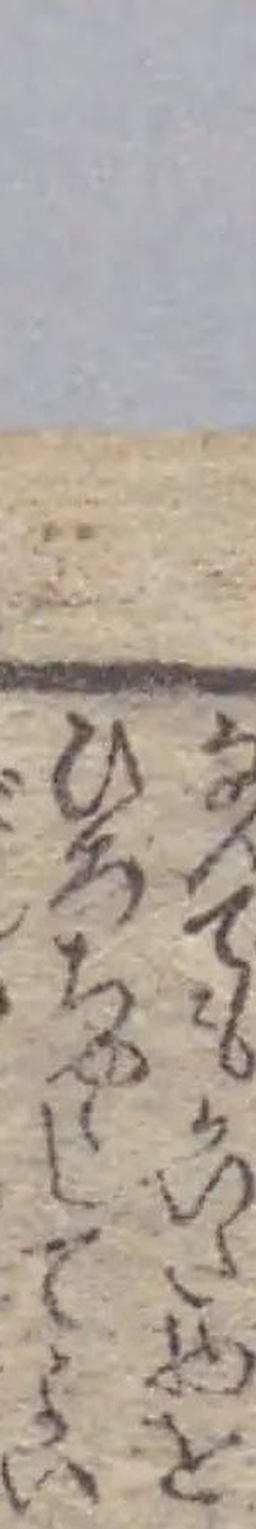ひろちやくしてよい
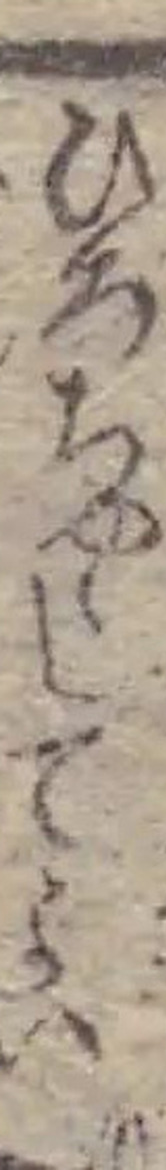ひろちやくしてよい
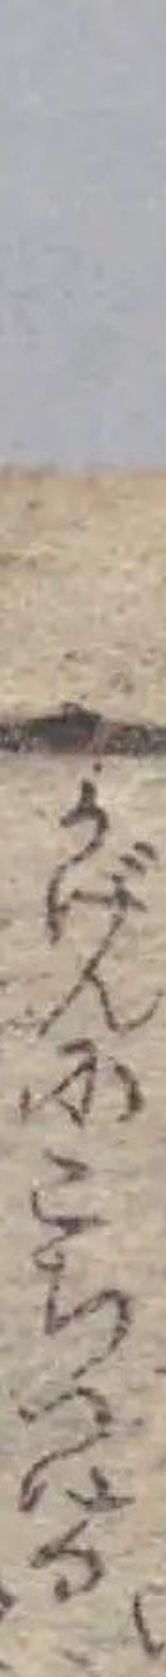かげんにこちつける
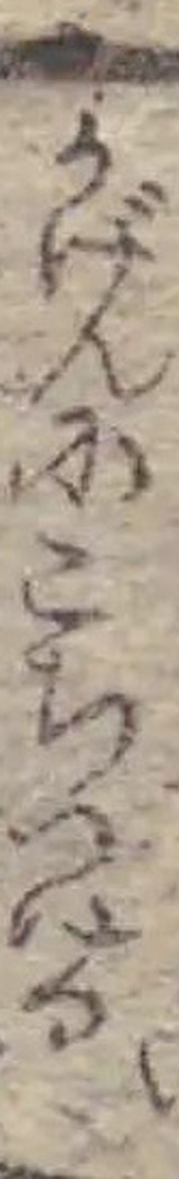かげんにこちつける
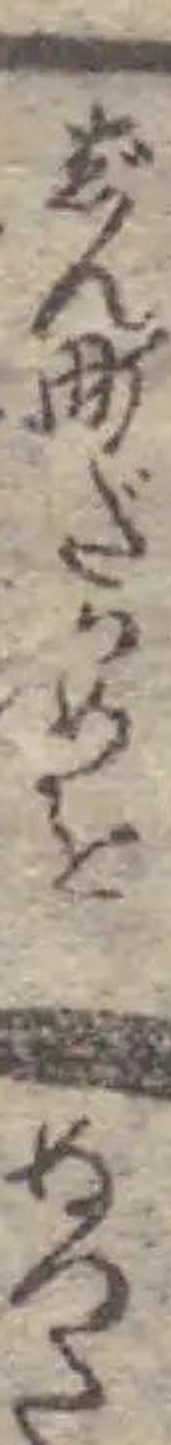じん町だかめをぬつた
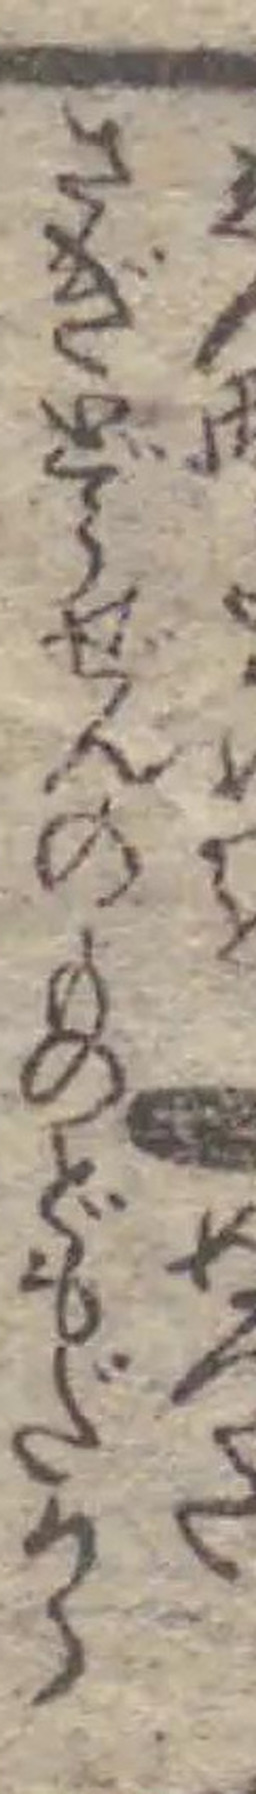さぎどうぜんのものどもだから
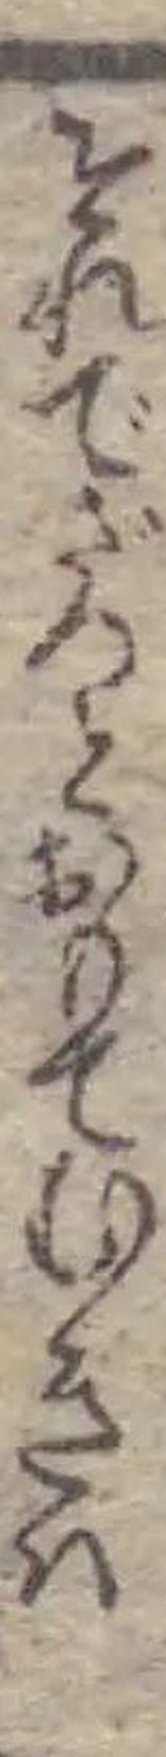それでざつとおもてむきは
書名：通増安宅関 2巻
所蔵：国立国会図書館 National Diet Library, JAPAN
